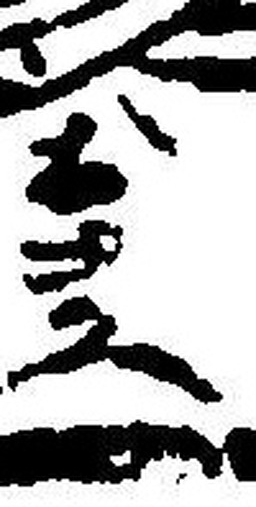おまへ
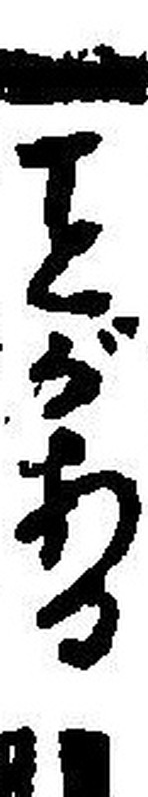ことがある
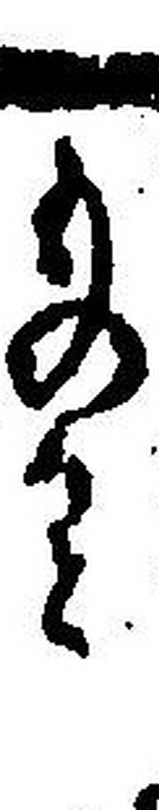ものかと
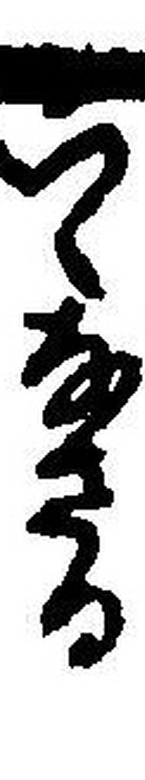いゝなさる
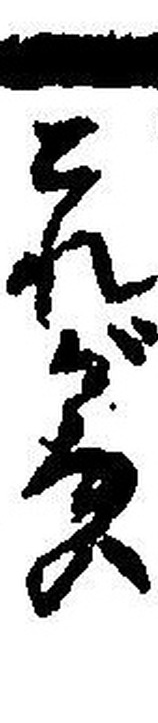これがない
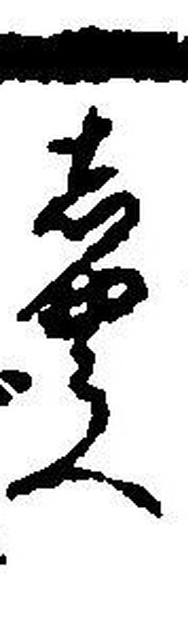しやうへ
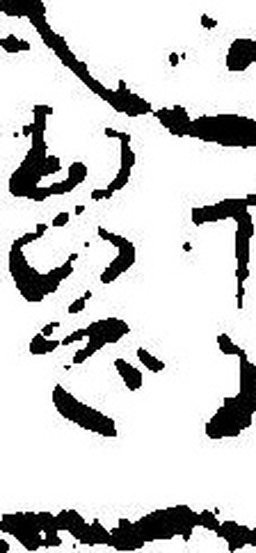おいで
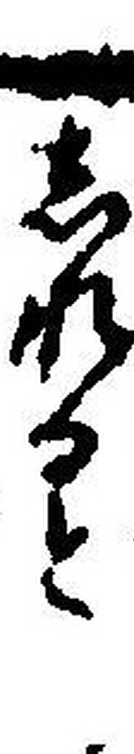しれると
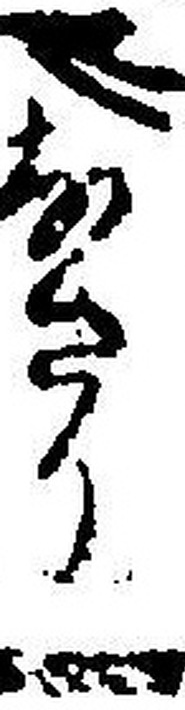なさり
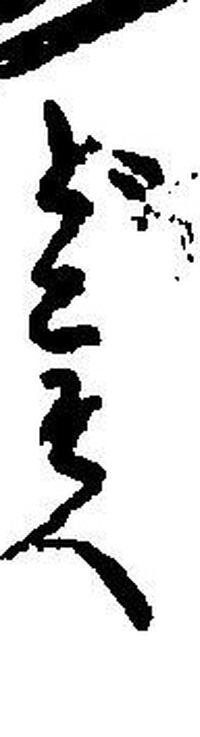どこそへ
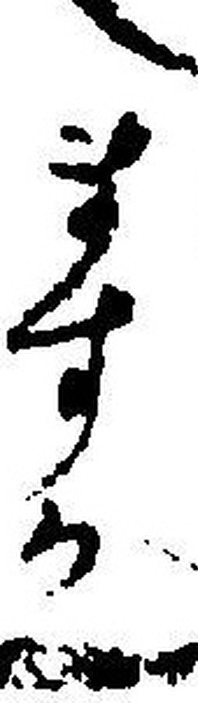ますか
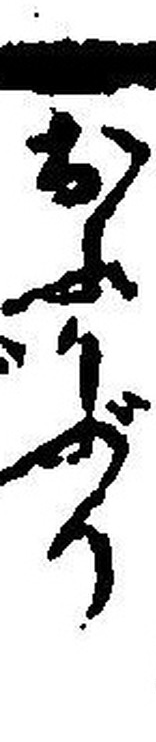おふかぶり
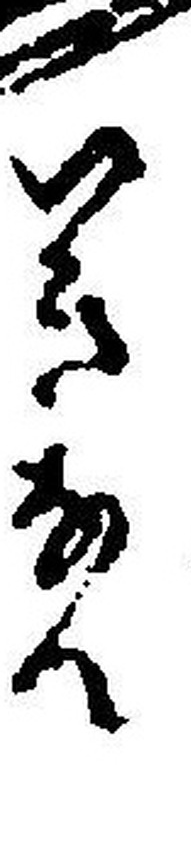いきなん
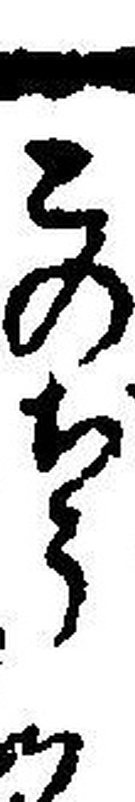このぢう
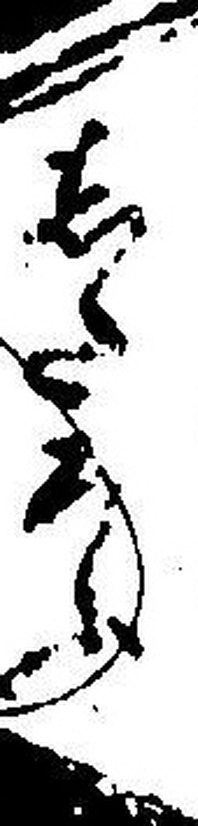したろふ
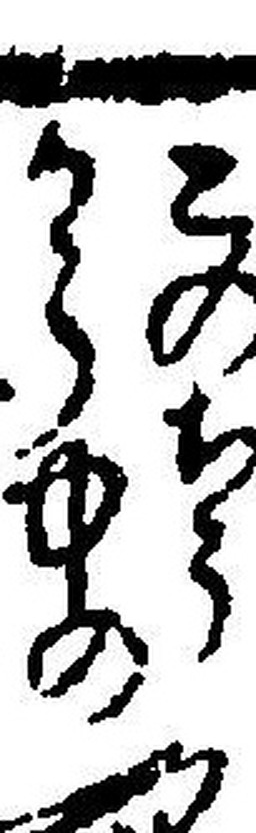から中の
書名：間違狐之女郎買 / 市場通笑作
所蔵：東京大学総合図書館 General Library in the University of Tokyo, JAPAN
